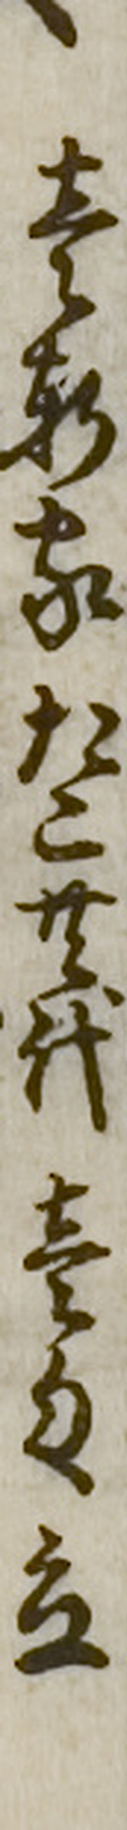小便壱軒家たこ共代壱匁立
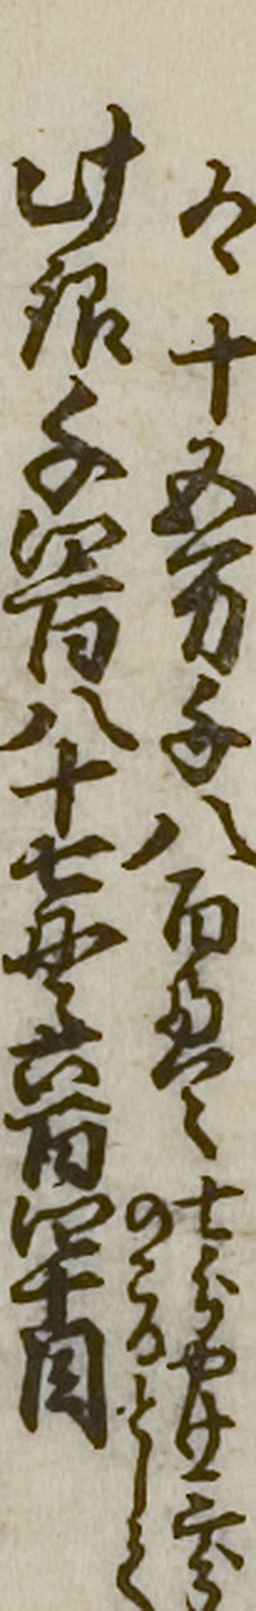此銀千四百八十七貫六百四十目
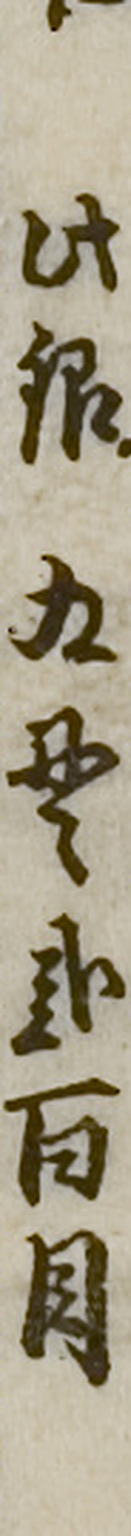此銀九貫弐百目
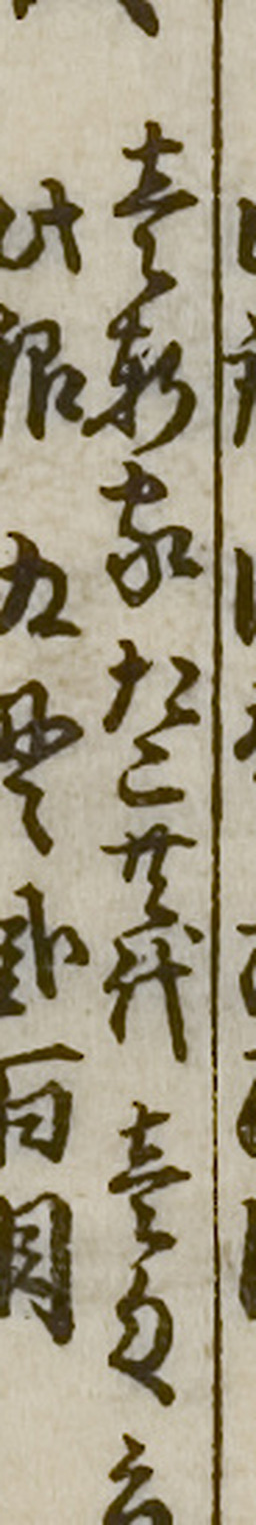此銀九貫弐百目
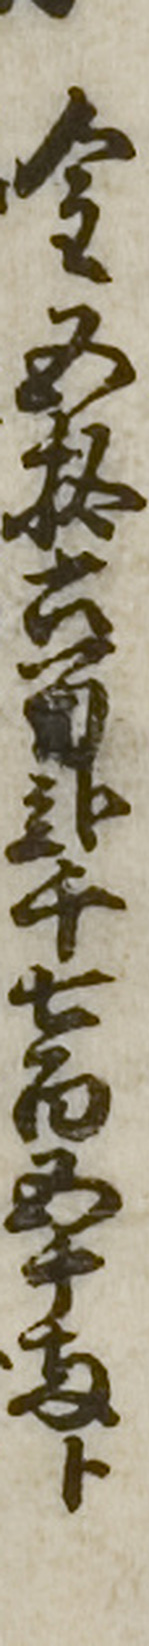合金五拾六万弐千七百五十両と
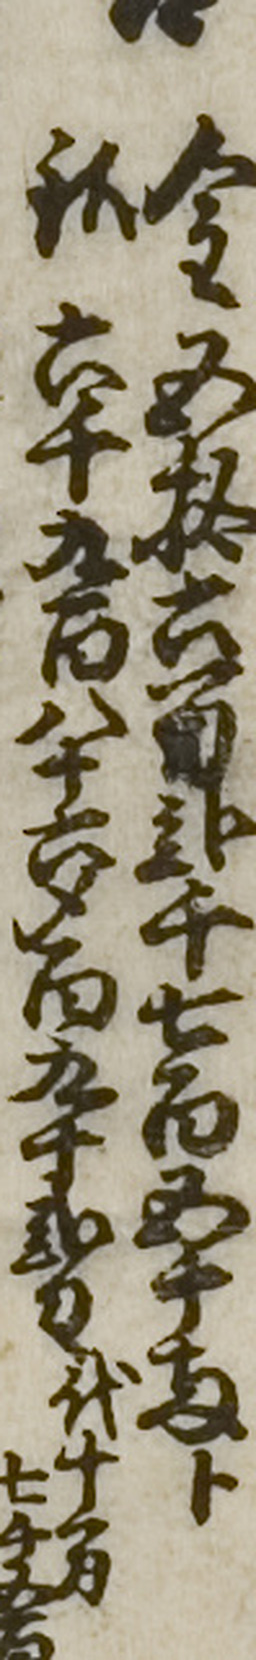銀六千九百八十六〆百九十弐匁代十万七千五百両
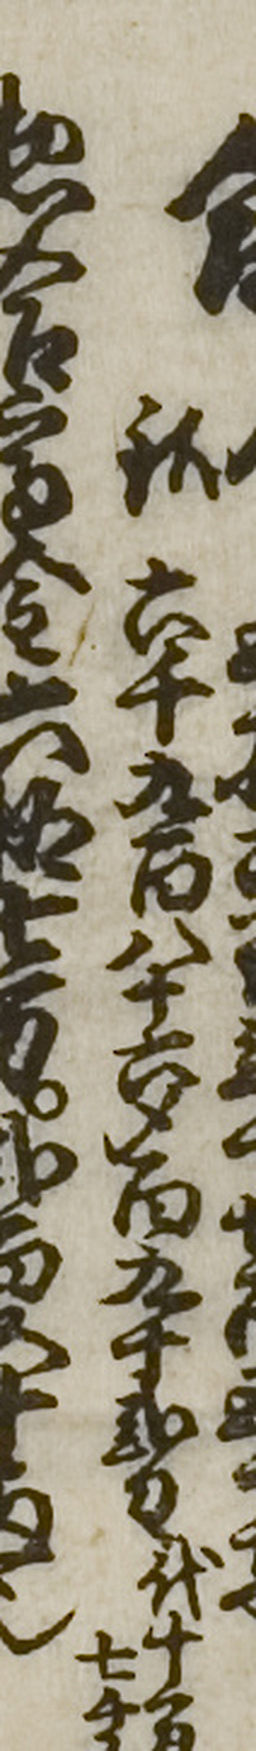惣合高金六拾七万○弐百五十両也
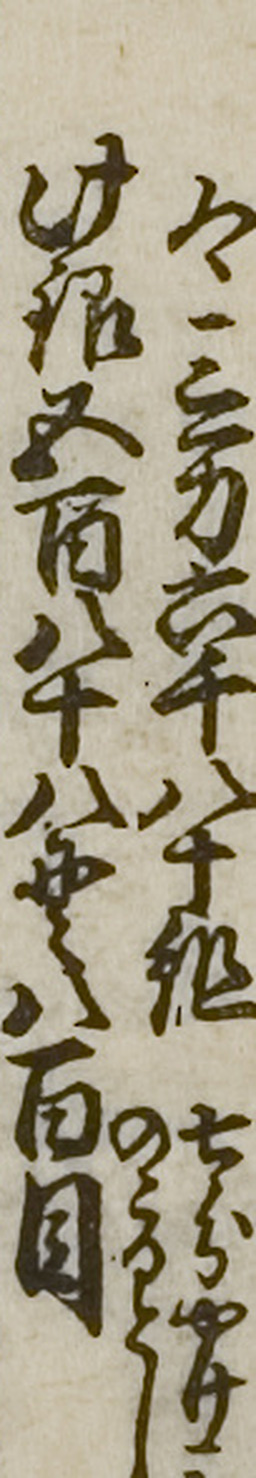此銀五百八十八貫八百目
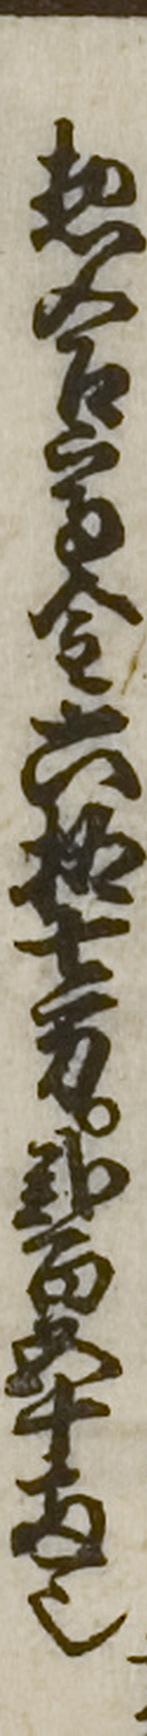惣合高金六拾七万○弐百五十両也
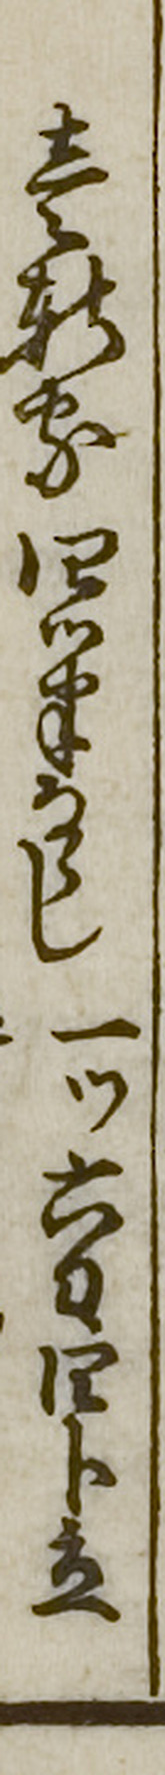あんどう壱軒家四ツ半ならし一ツ六匁四分立
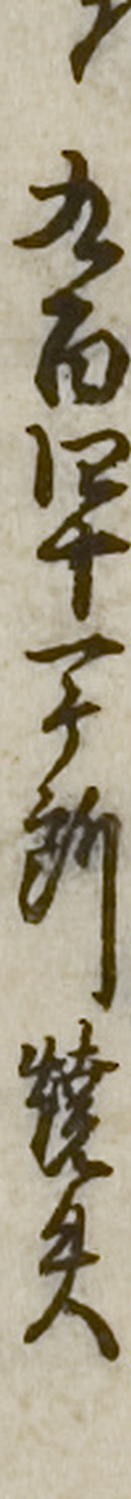九百四十一ケ所焼失
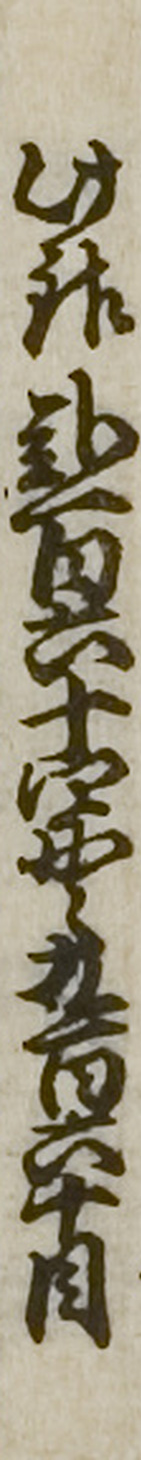此銀弐百六十四貫九百六十目
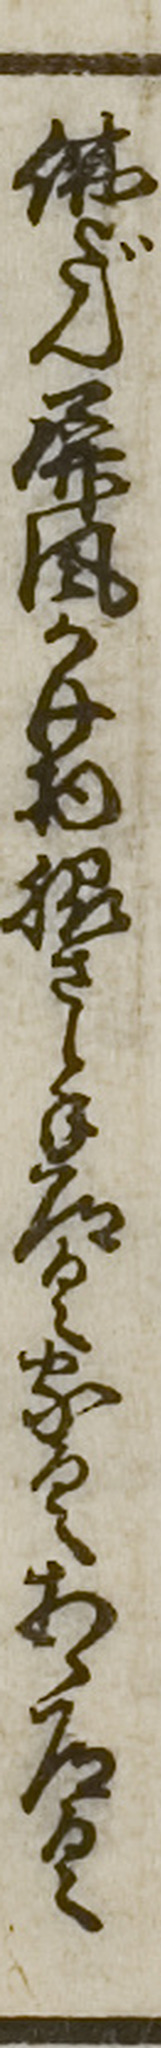仏だん屏風かけ物脇さし手道具家具おゝ道具
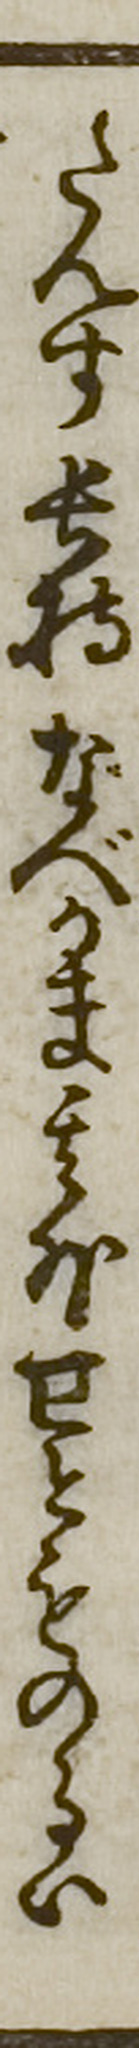たんす長持なべかま其外せとものるい
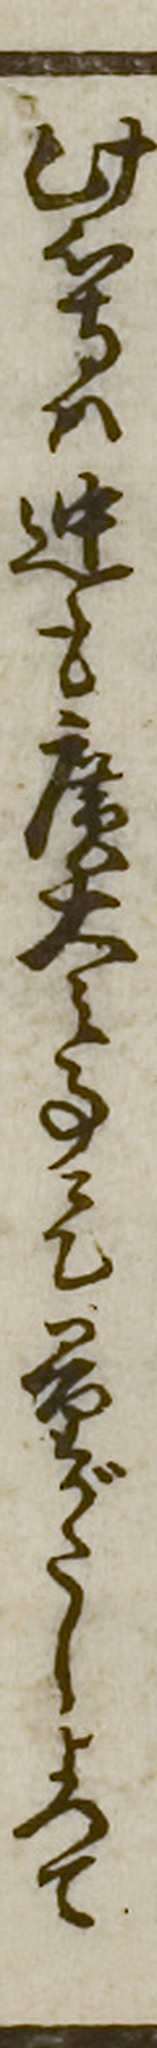此等は迚も広大之事にて量がたしよつて
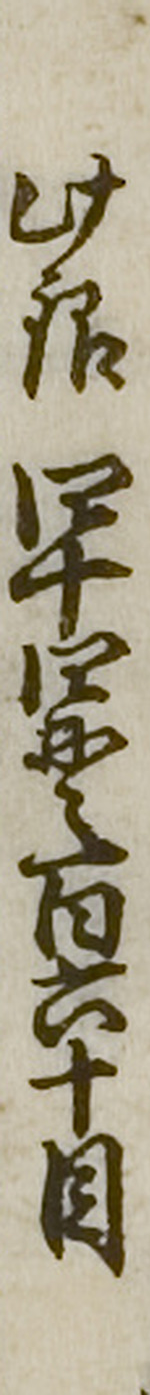此銀四十四貫百六十目
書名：上京火災町家雑具損亡考記
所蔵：東京大学総合図書館 General Library in the University of Tokyo, JAPAN
